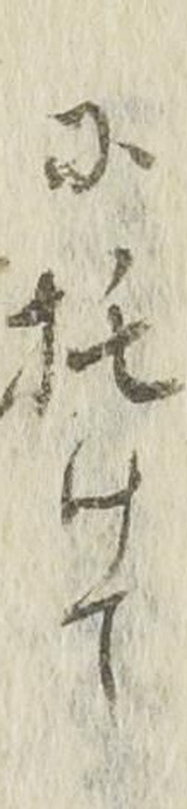に托けて
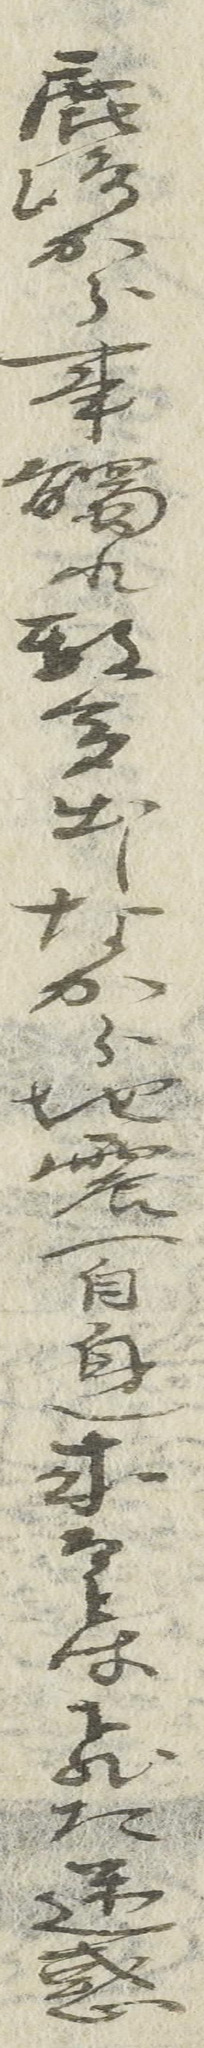鹿嶋から事觸れ数多出しなから地震来るとは飛た迷惑
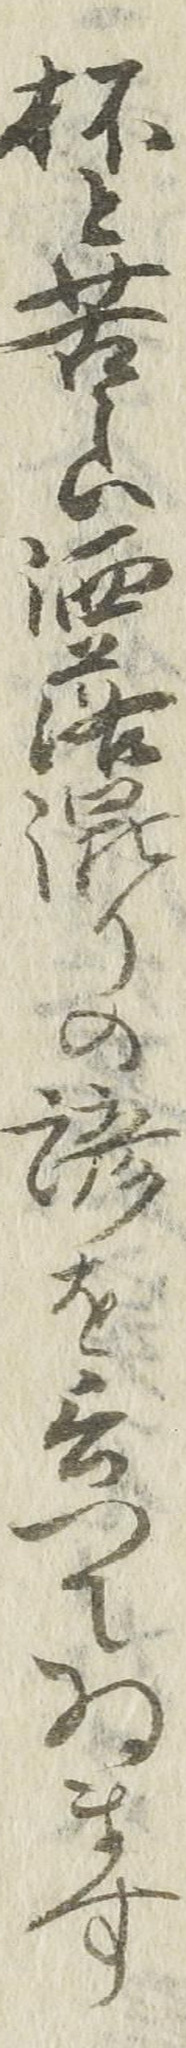抔と苦しい洒落混りの諺を云つてゐます
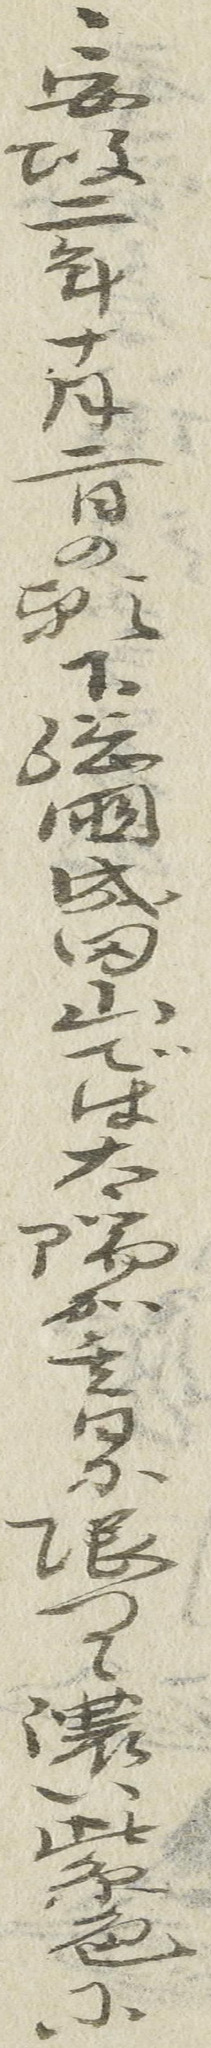一安政二年十月二日の朝下総国成田山では太陽が其日に限つて濃い紫色に
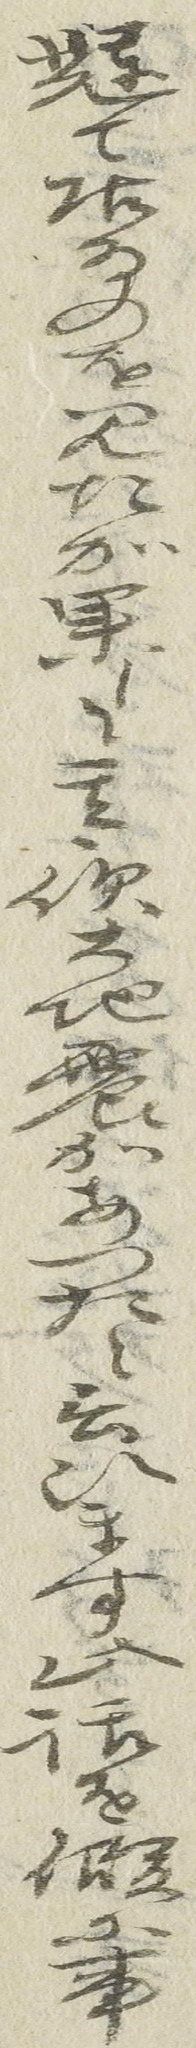輝て居るのを見たが果して其夜大地震があつたと云ひます此話を假に事
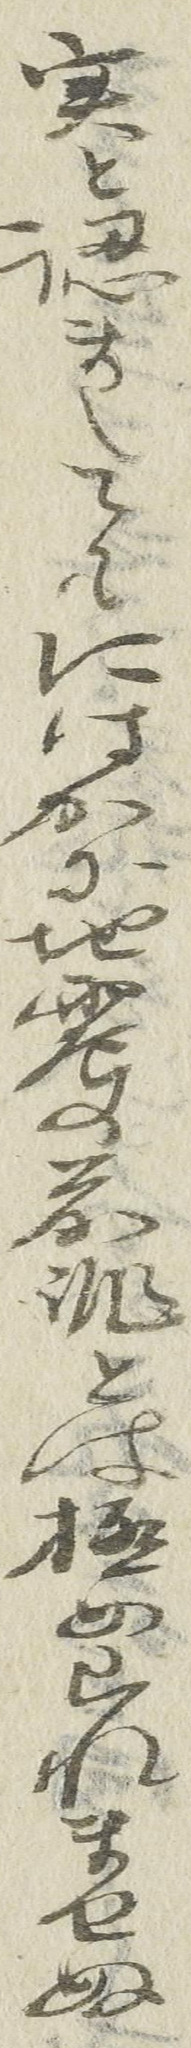実と認ましてもにはかに地震の前兆とは極められませぬ
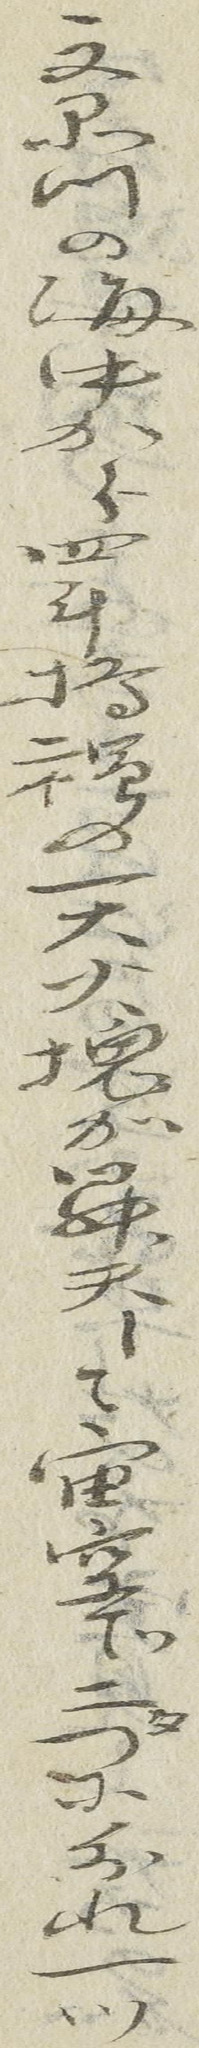一又品川の海中から四斗樽程の一大火塊が昇天して宙空で二つに分かれ一つ

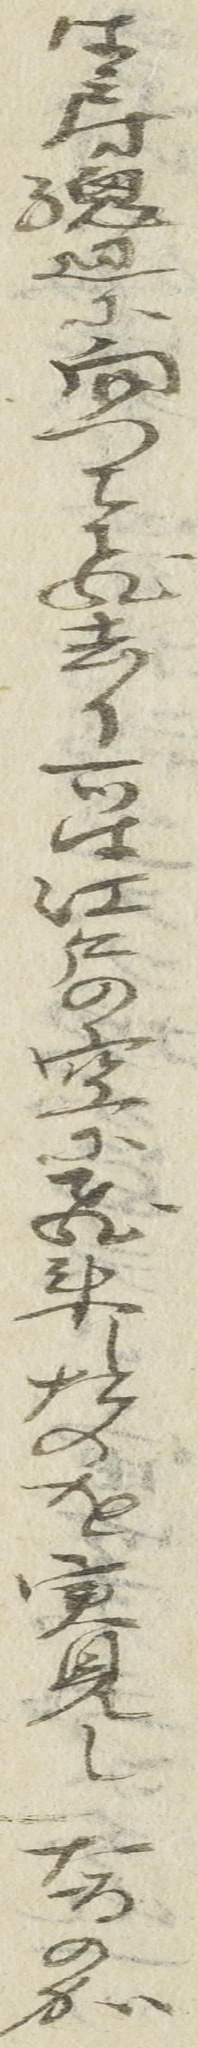は房総辺に向つて飛去り一つは江戸の空に飛来したのを実見したるのが
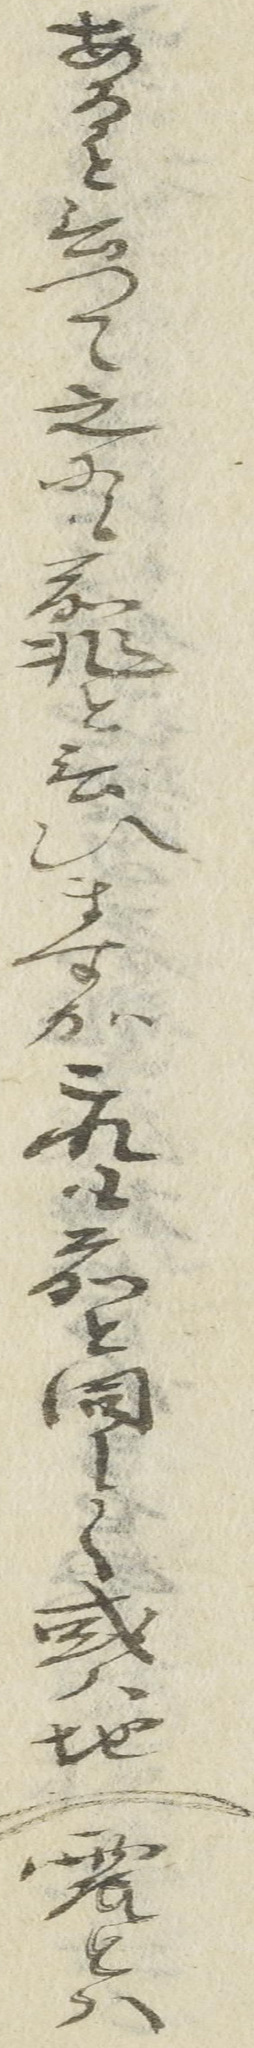あると云つて之にも前兆と云ひますがこれも前と同しく或は地震とは
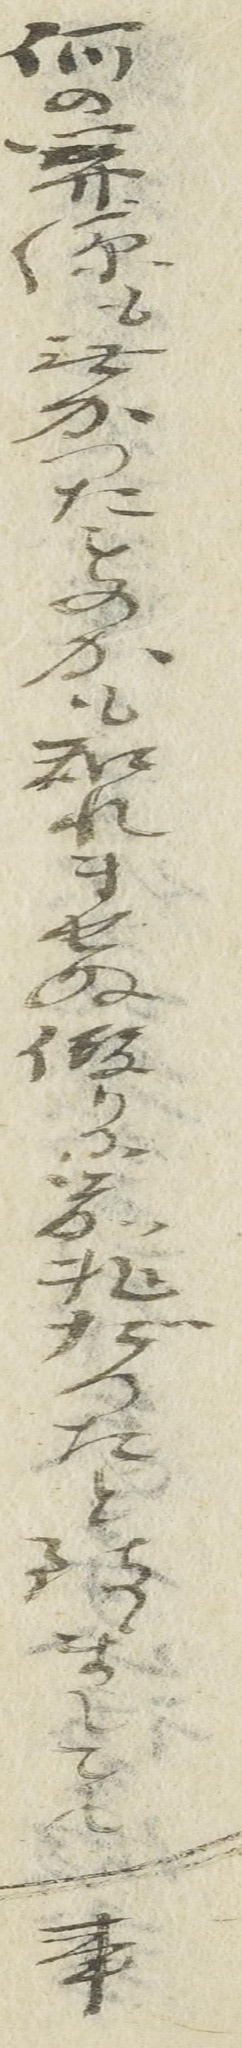何の關係もなかつたものかも知れませぬ假りに前兆だつたと致しましても事
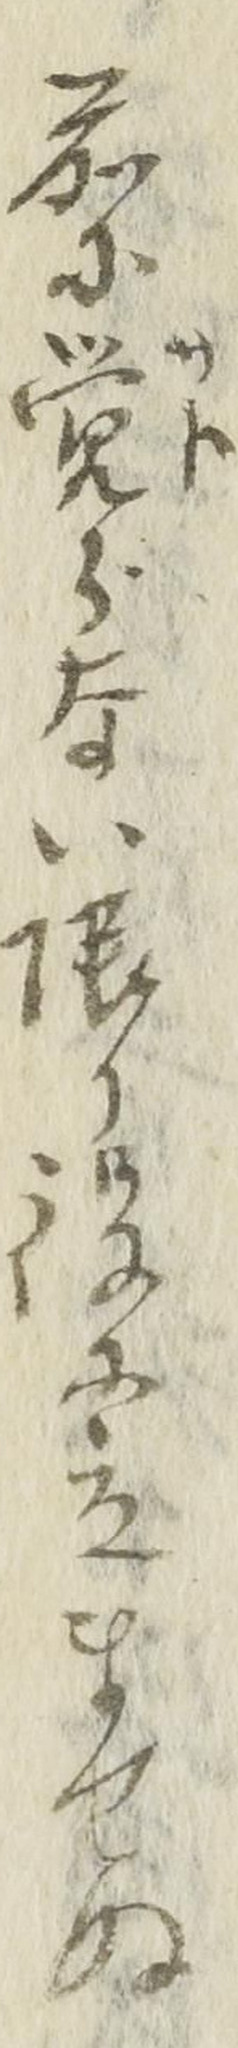前に覚らない限り役に立ませぬ
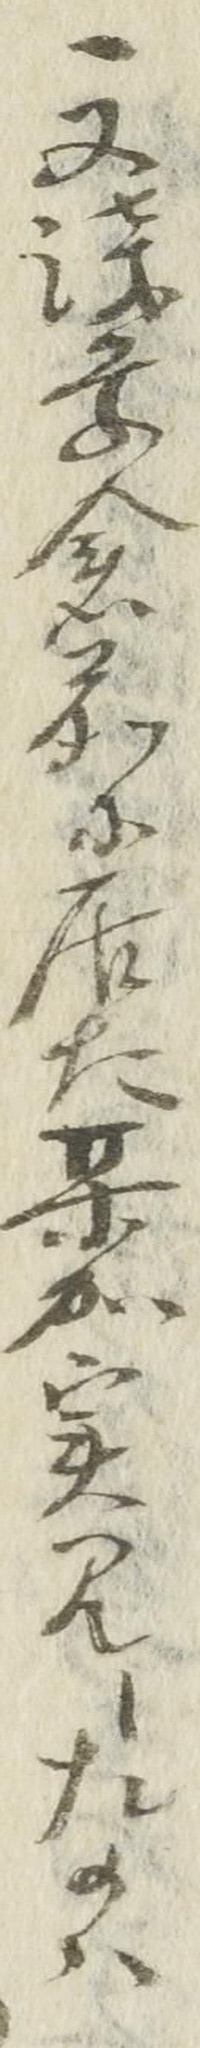一又浅草倉前に居た某が実見したのは
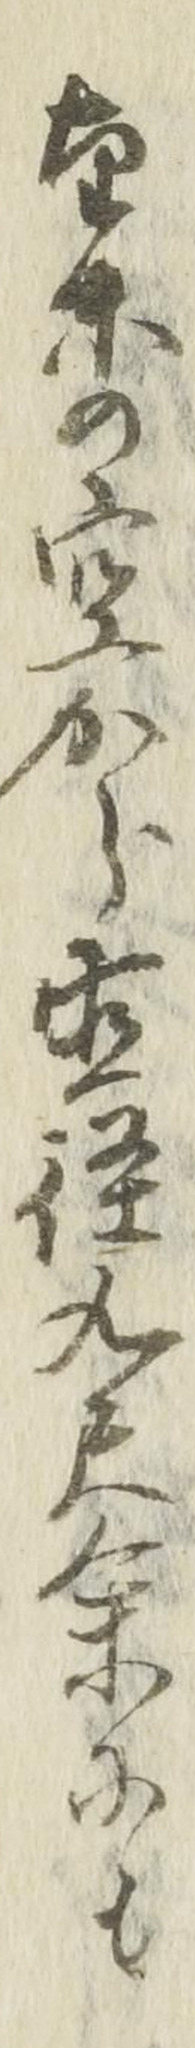東京の空から直径九尺余にも
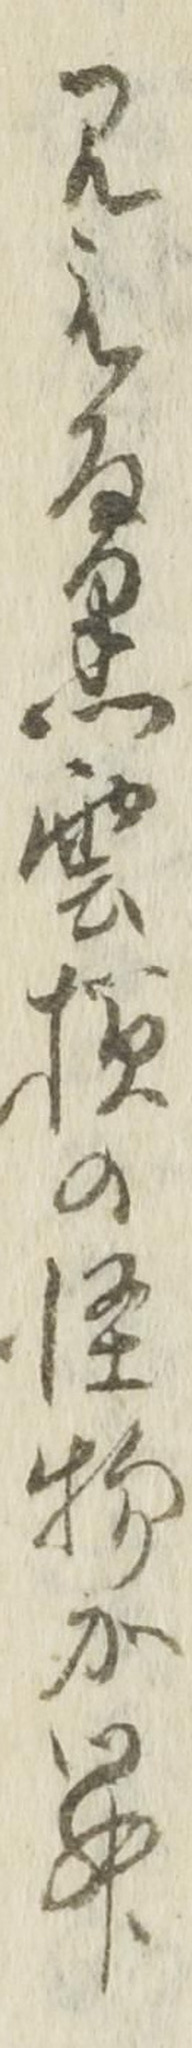見える黒雲様の怪物が昇
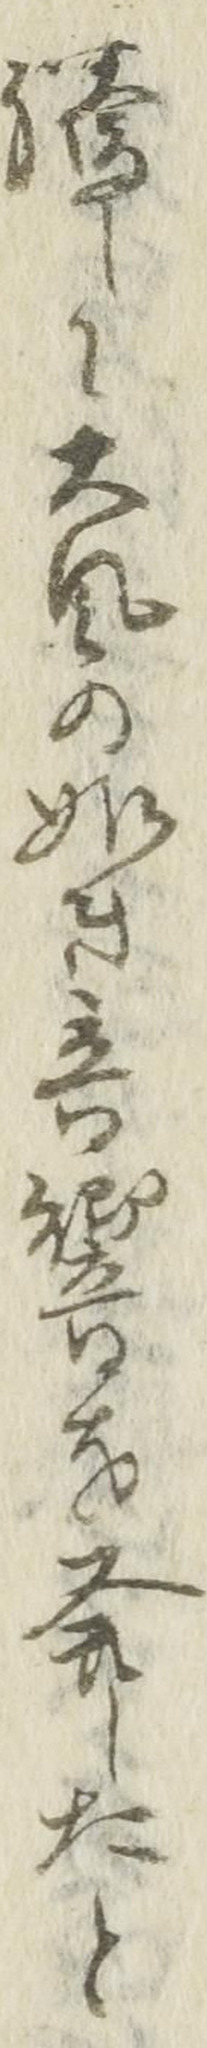騰して大風の如き音響を発したと
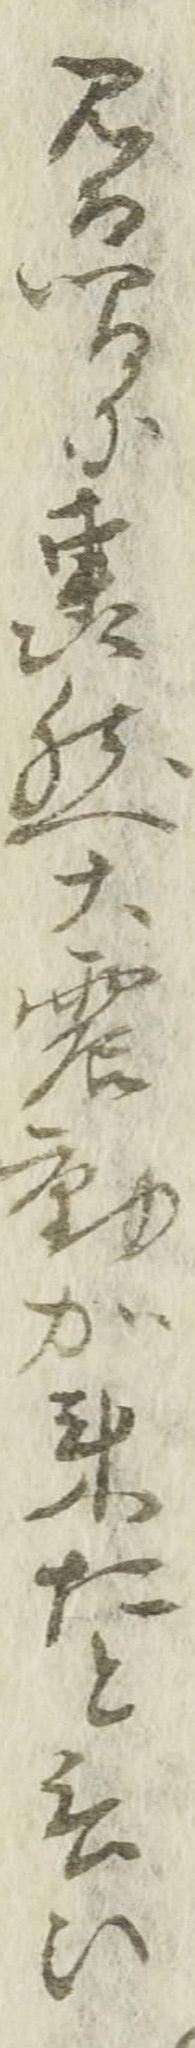見る間に轟然大震動が来たと云ひ
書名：地震前兆集　全
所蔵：東京大学地震研究所図書室 Earthquake Research Institute Library, The University of Tokyo, JAPAN
